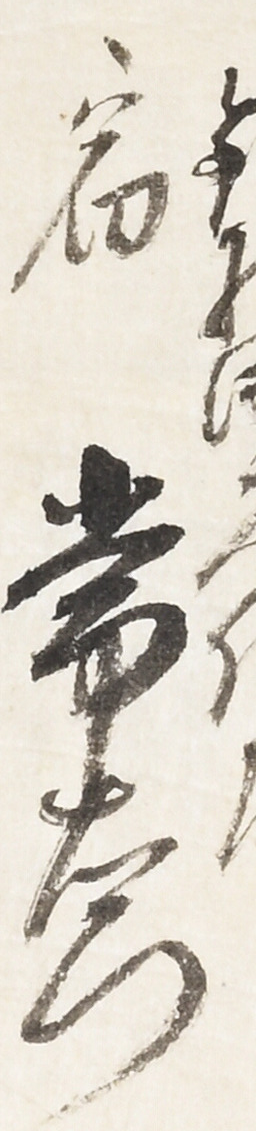宿常右衛門
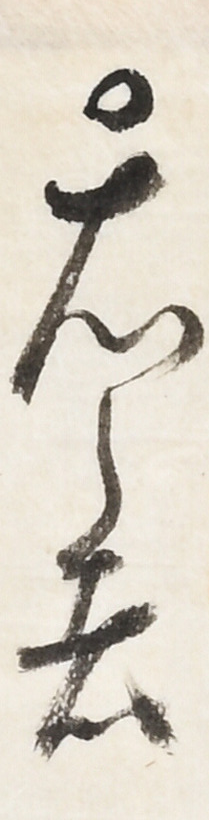〇右之者
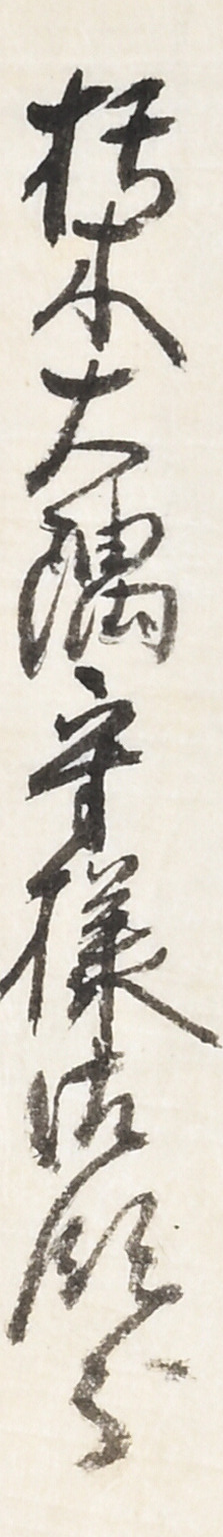朽木大隅守様御領分
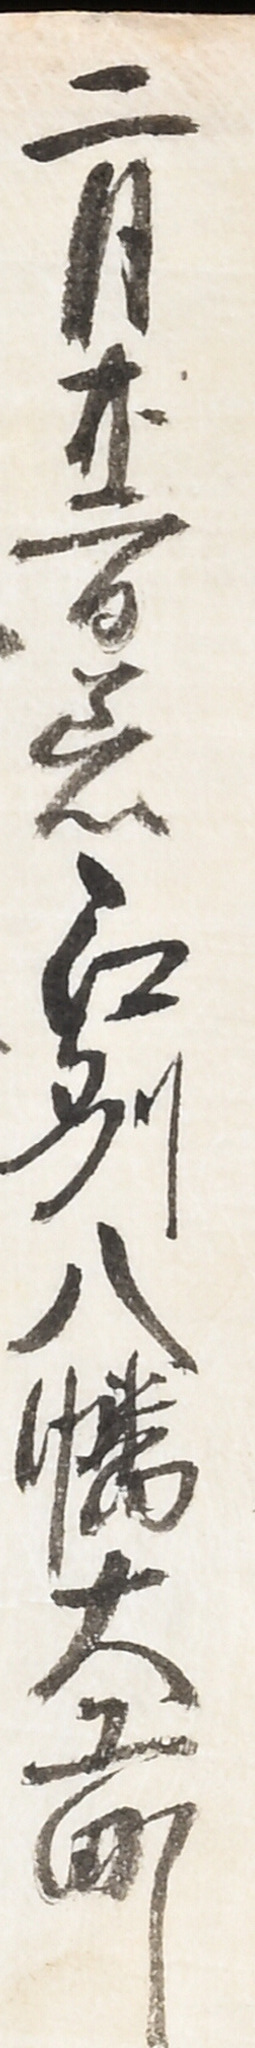二月廿ニ日着江州八幡大工町
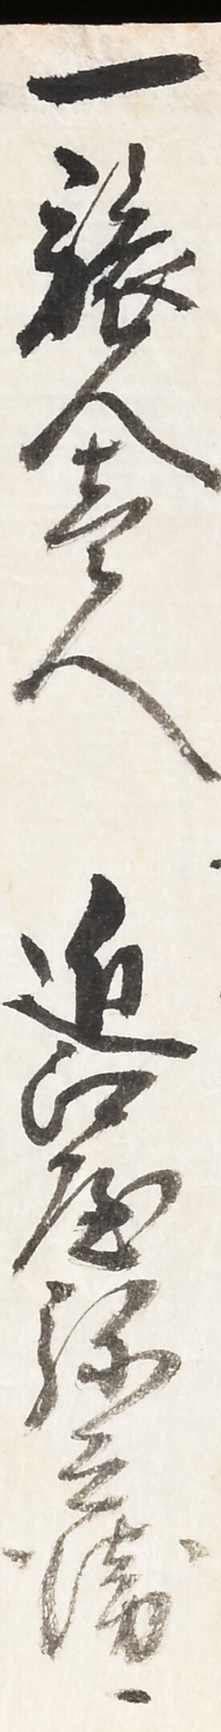一旅人壱人近江屋弥兵衛・
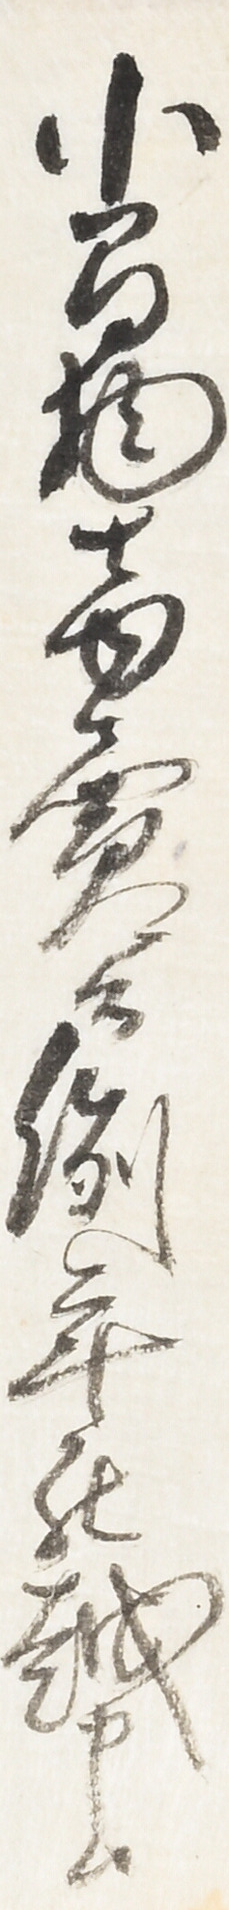小間物商売ニ而例年罷越申候
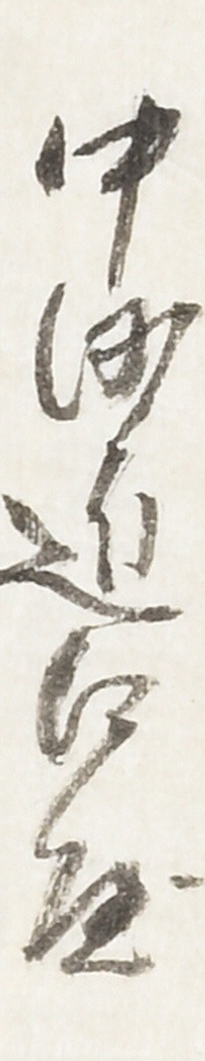中町近江屋
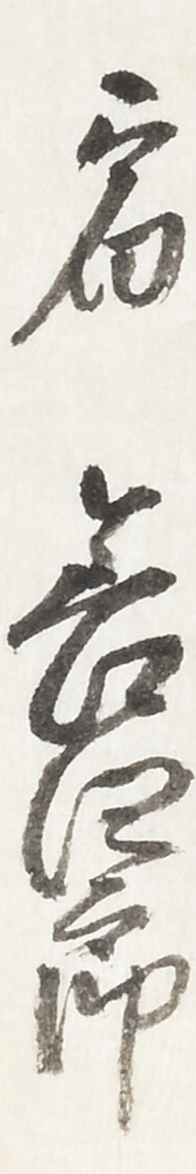宿善四郎
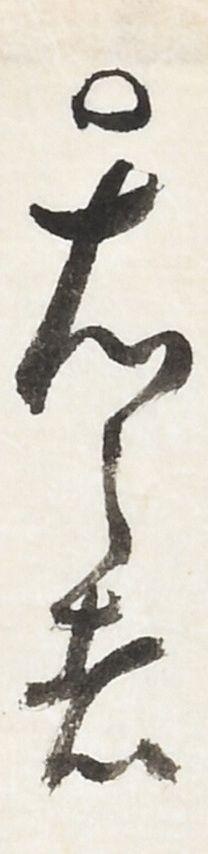〇右之者
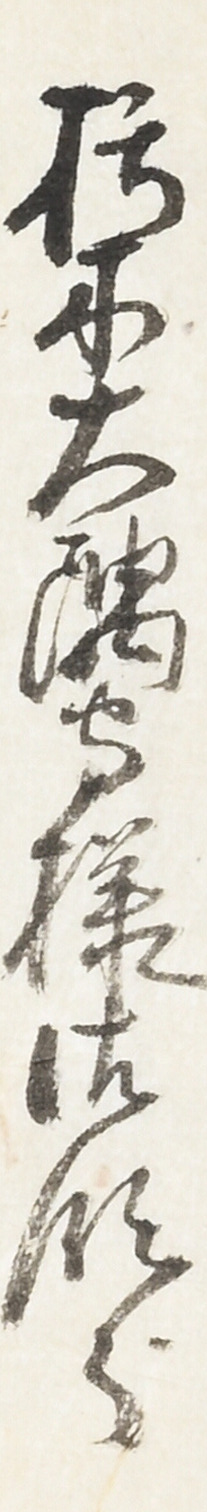朽木大隅守様御領分
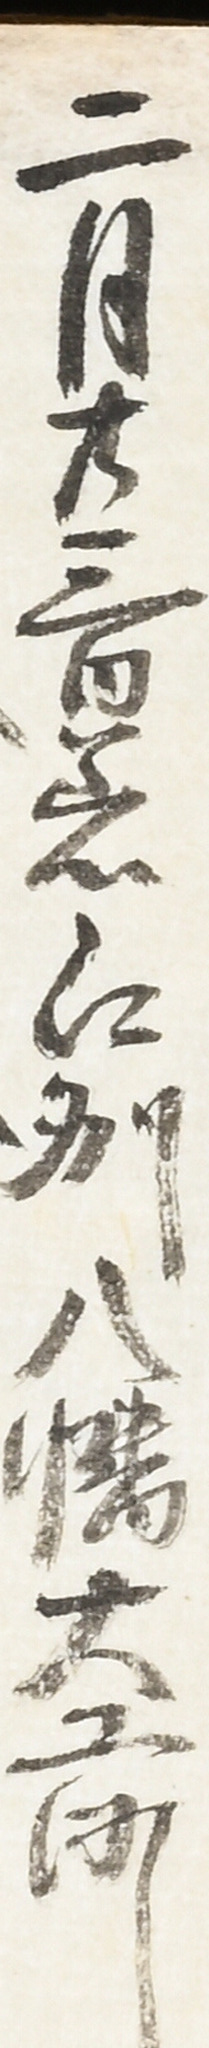二月廿三日着江州八幡大工町
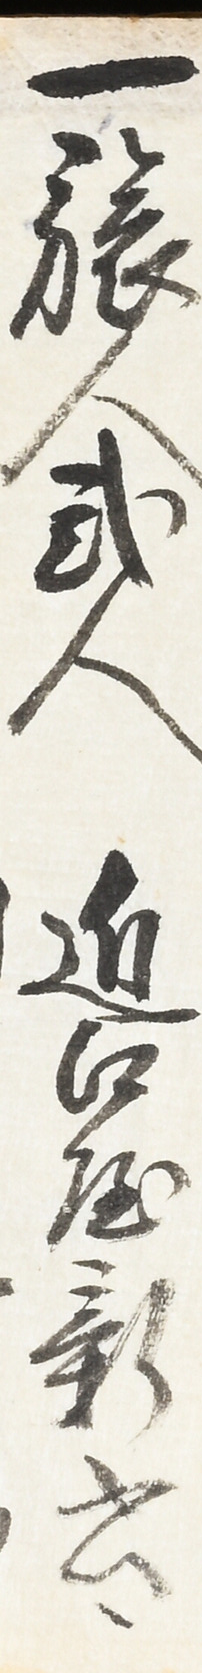一旅人弐人近江屋新六・
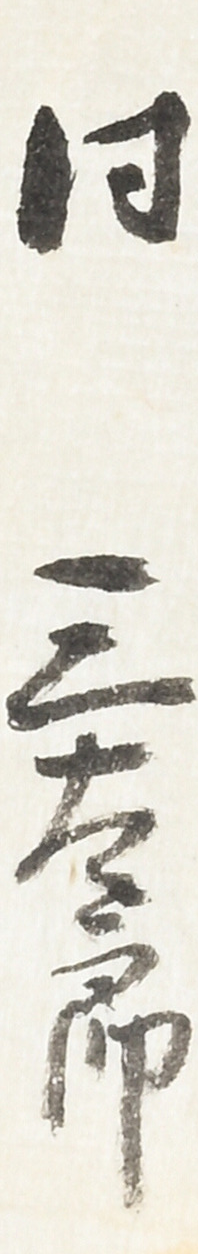同三太郎
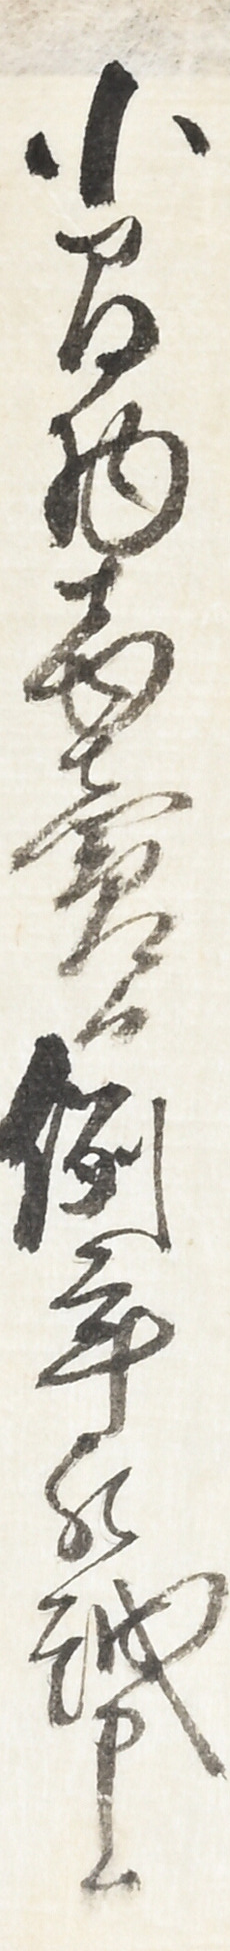小間物商売ニ而例年罷越申候
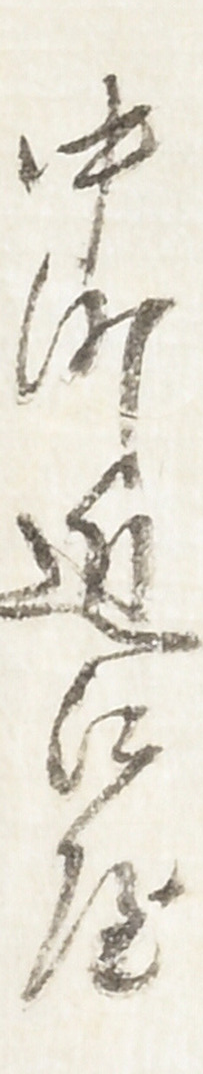中町近江屋
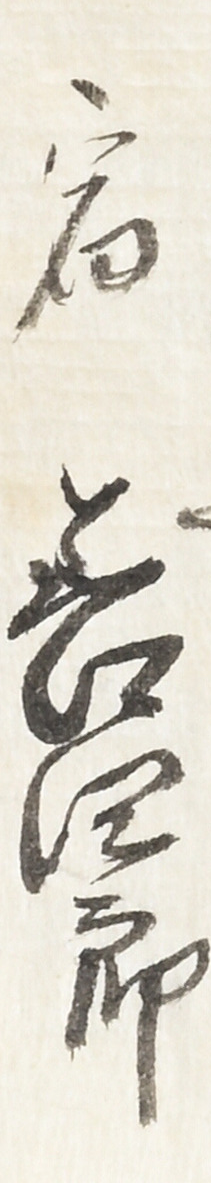宿善四郎
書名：旅人泊控帳
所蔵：伊那市立高遠町図書館・合同会社AMANE
